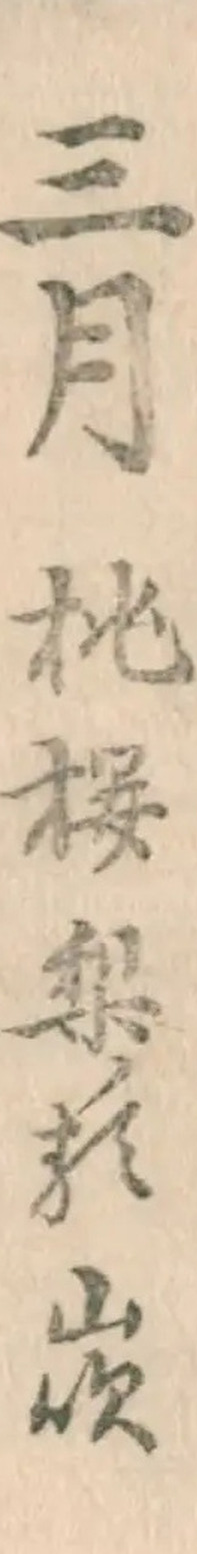三月桃桜梨ノ類山吹
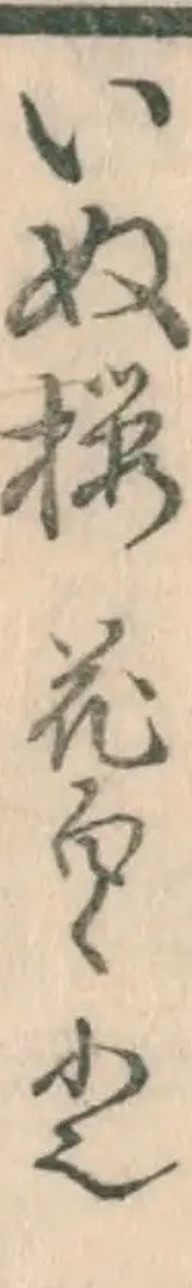いぬ桜花白く小也
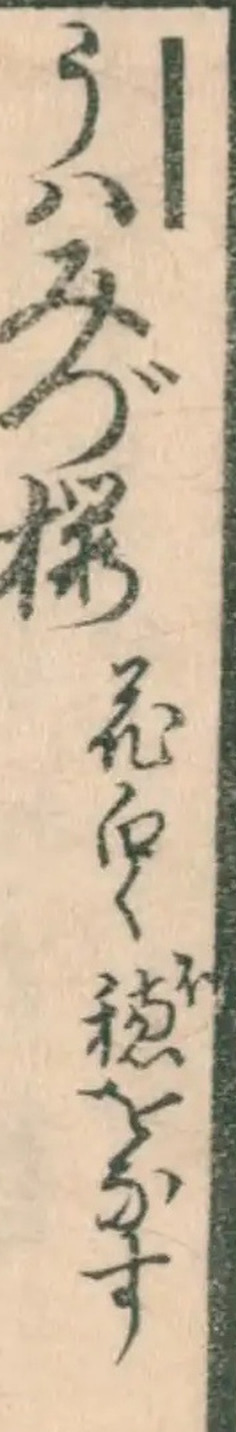うはみづ桜花白く穂をなす
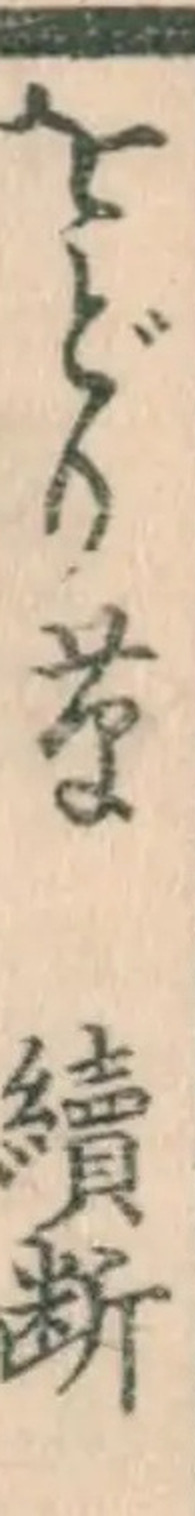をどり草続断
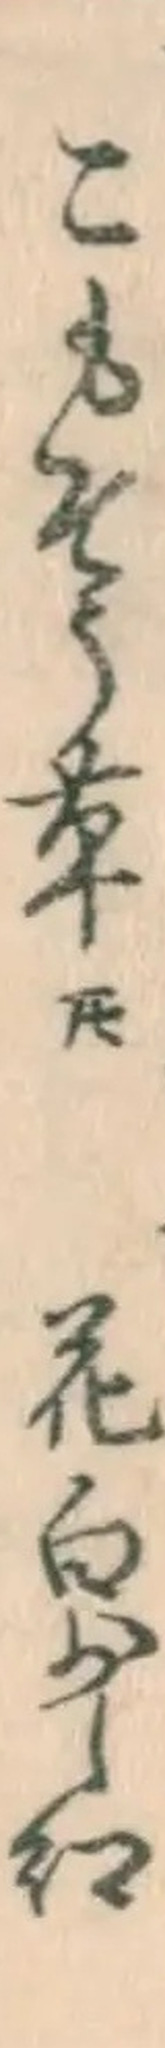こもそう草トモ花白少し紅
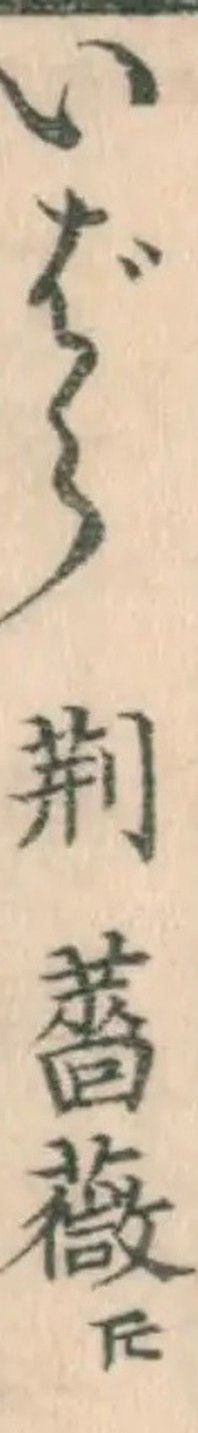いばら荊薔薇トモ
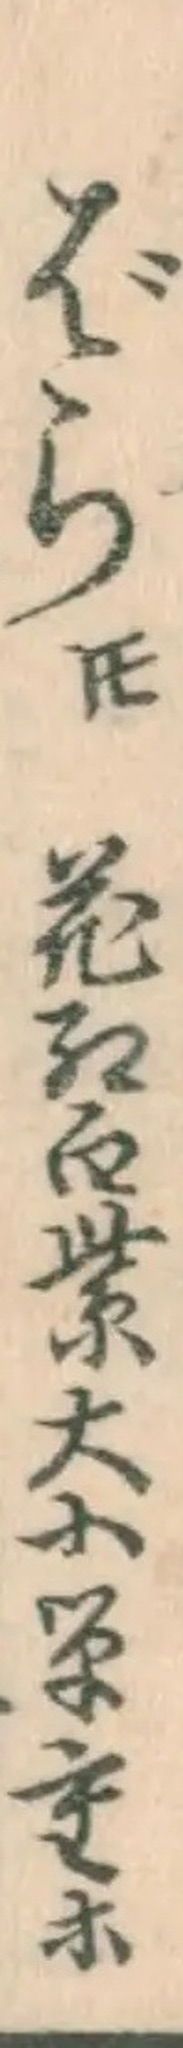ばらトモ花紅白紫大小単重
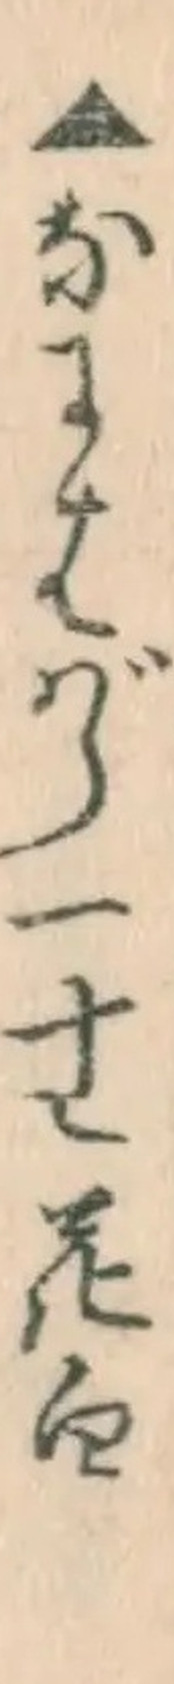▲なにはばら一寸花白
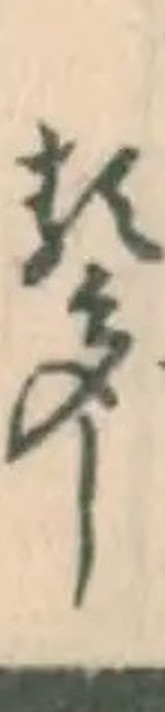類多し
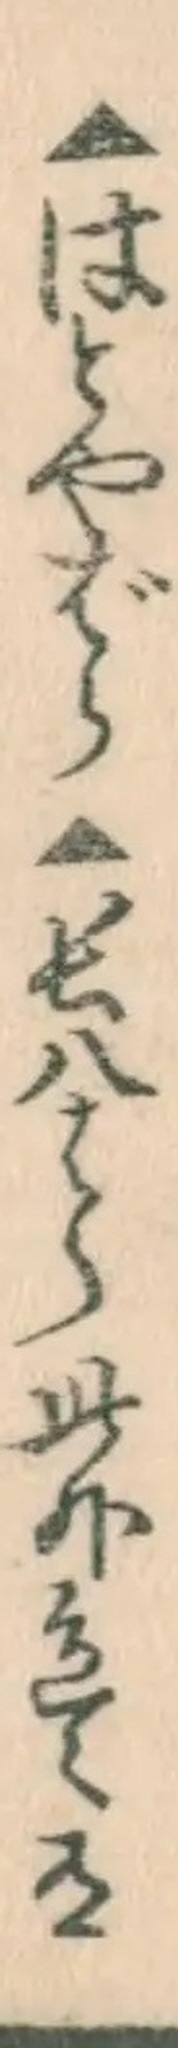▲はとやばら▲長八はら此外色々有

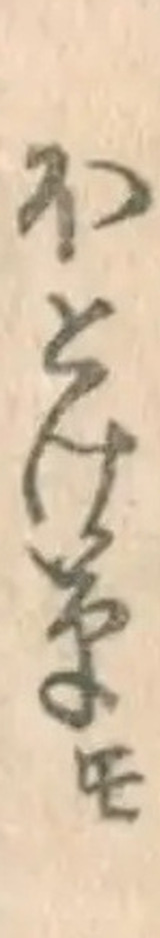ほとけ草共
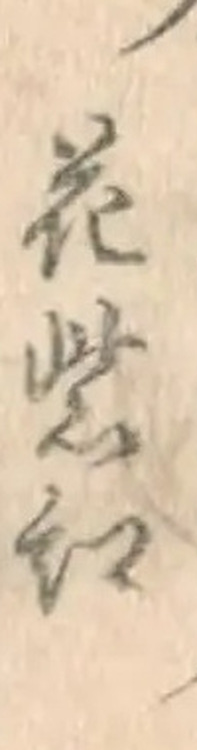花紫紅
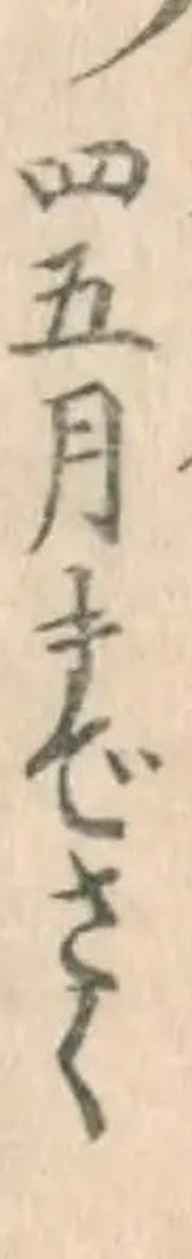四五月までさく
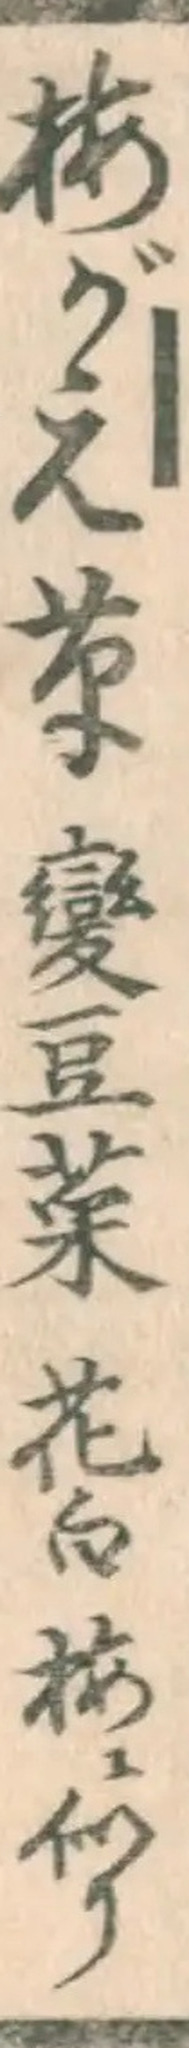梅がえ草豆菜花白梅に似り
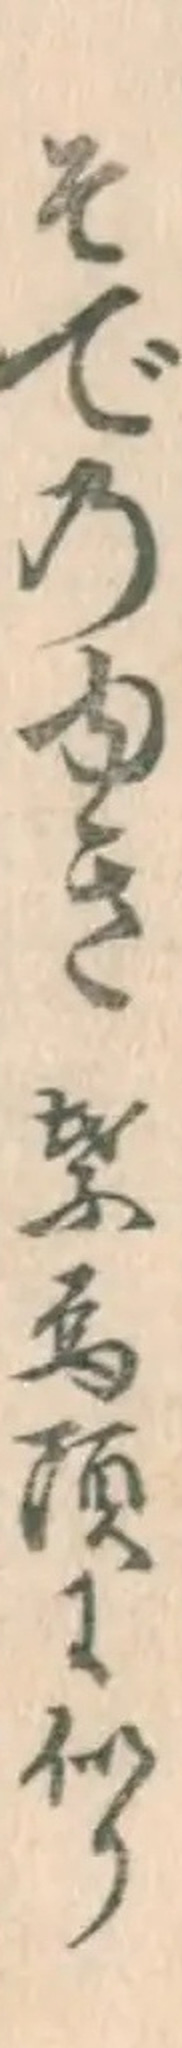そでにゆき鳥頭に似り
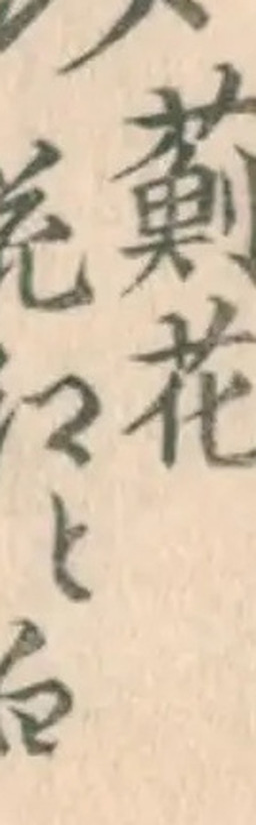花紅と白
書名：茶席挿花集
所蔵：国立国会図書館 National Diet Library, JAPAN
